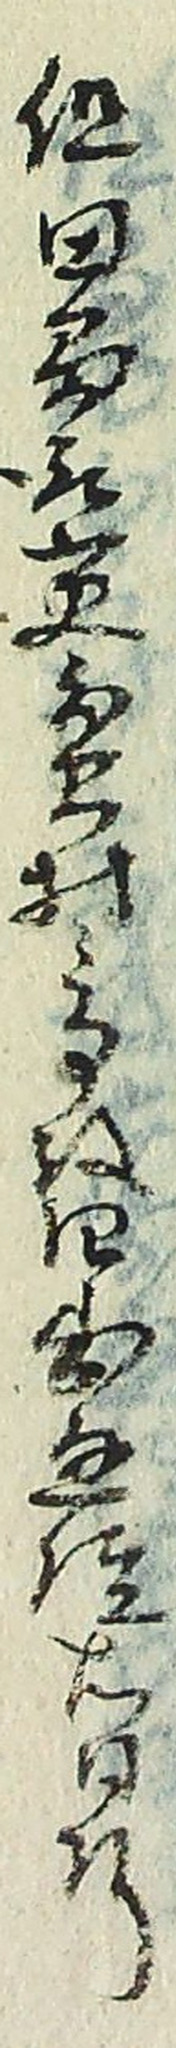但田畠取交貧村之事故四歩通位右同断
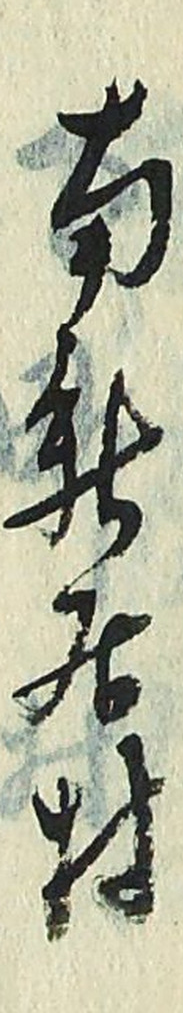南新居村
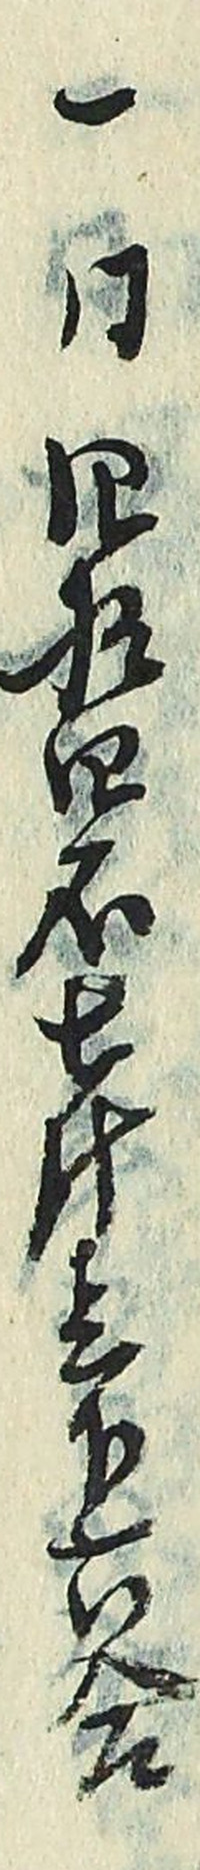一同四拾四石七斗壱升六合
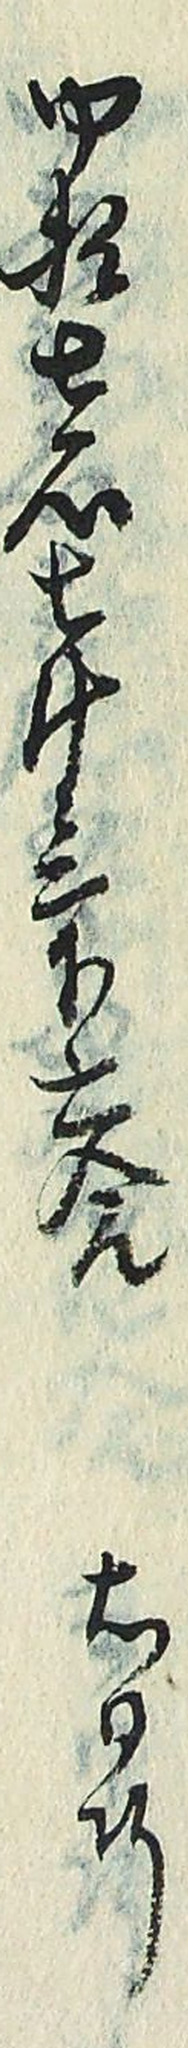内拾七石七斗壱升六合右同断
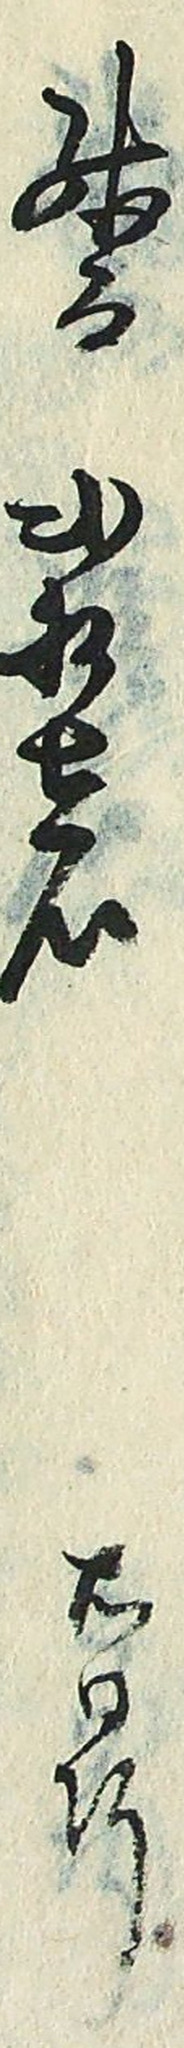残而弐拾七石右同断
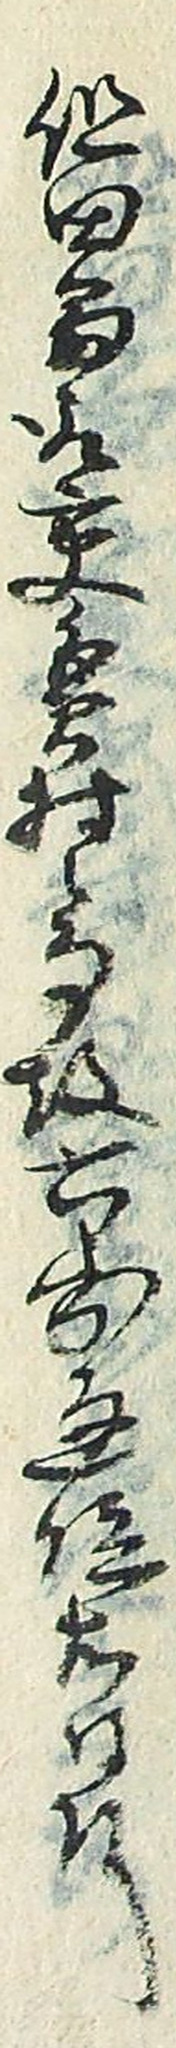但田畠取交貧村之事故六歩通位右同断

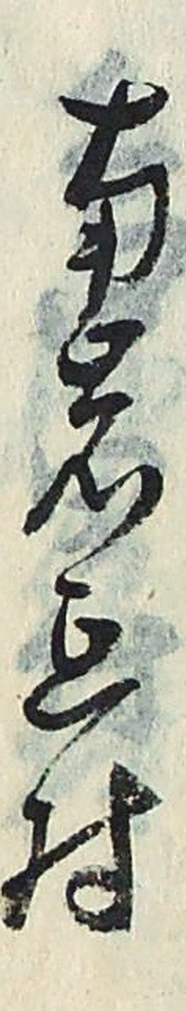南岩延村
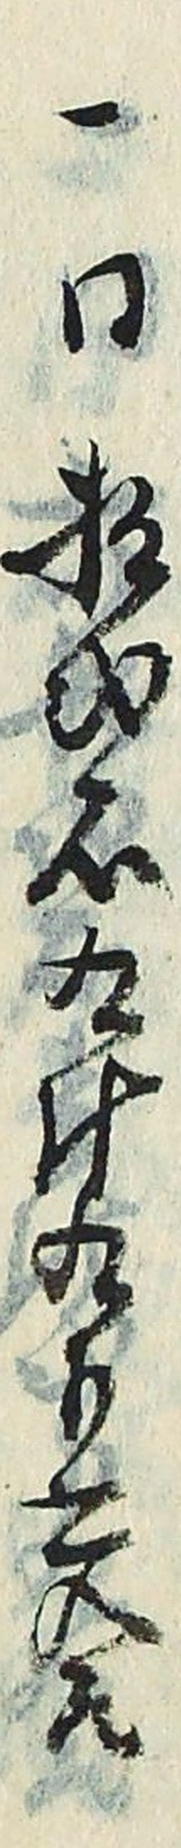一同拾弐石九斗九升六合
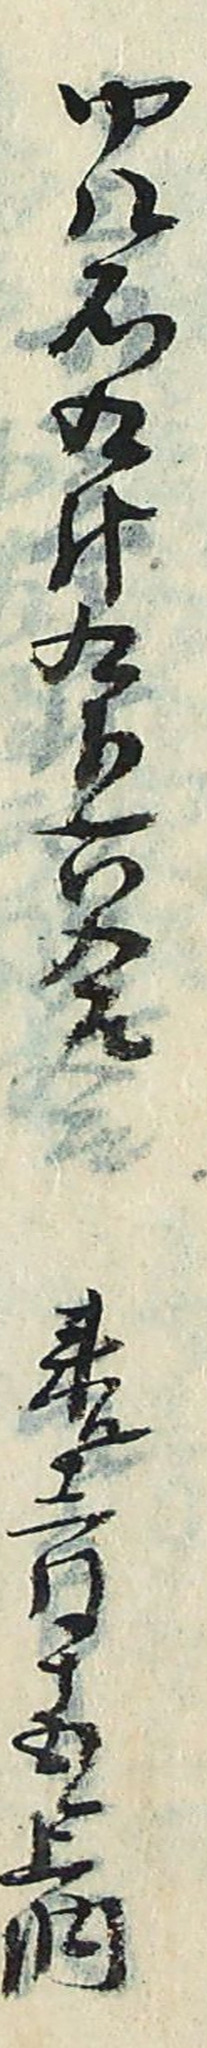内八石九斗九升六合来ル十二月十五日上納
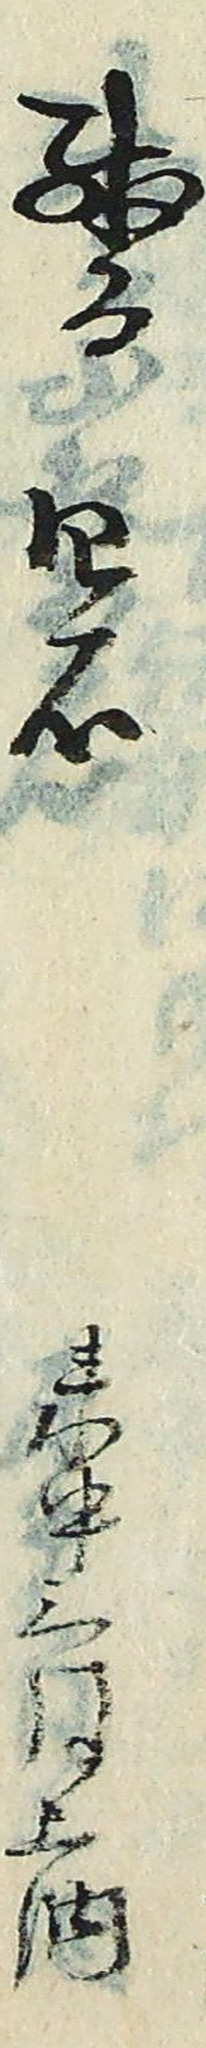残而四石来申三月上納
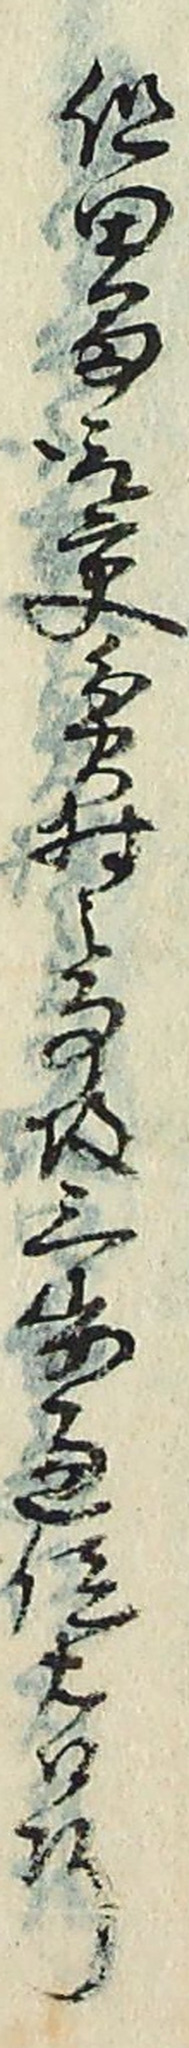但田畠取交貧村之事故三歩通位右同断
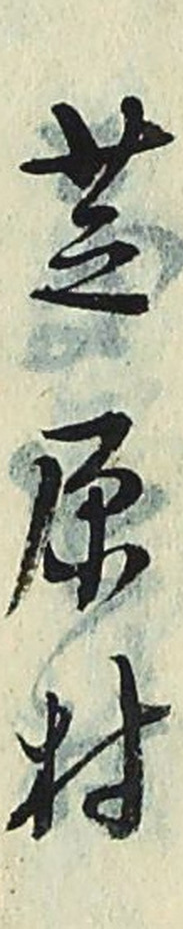芝原村
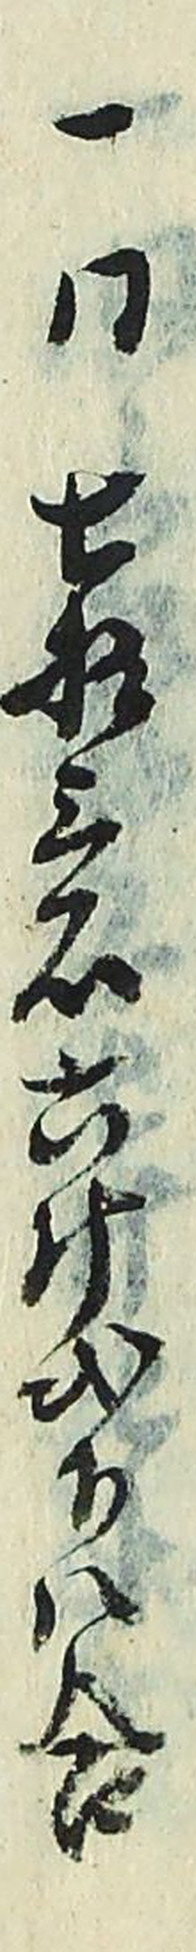一同七拾三石六斗弐升八合
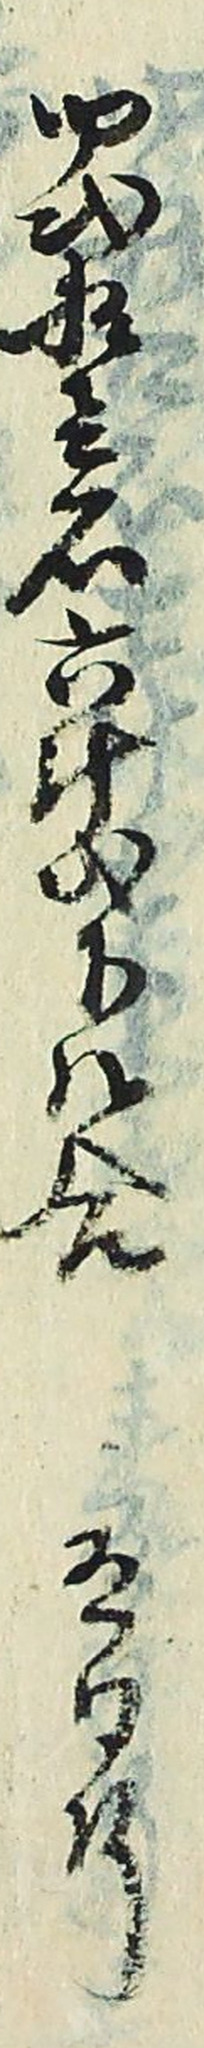内弐拾壱石六斗弐升八合右同断
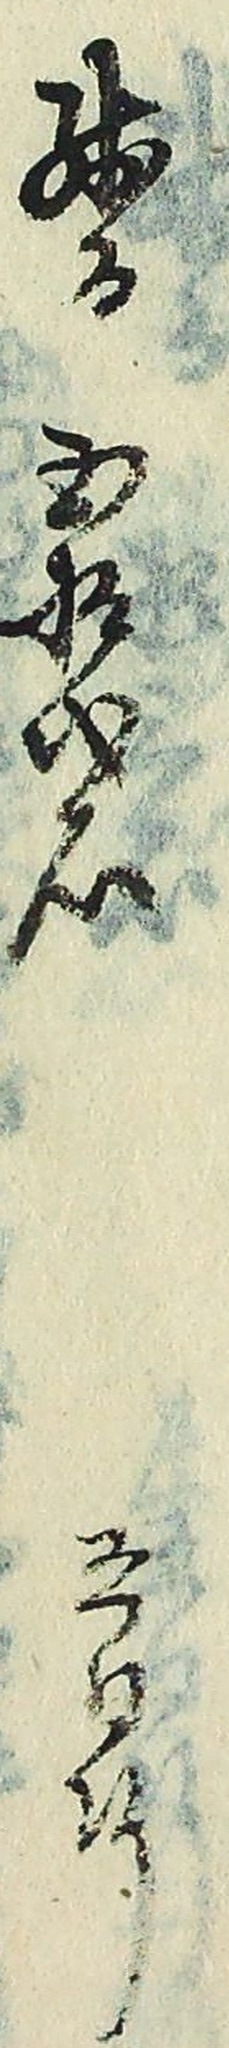残而五拾弐石右同断
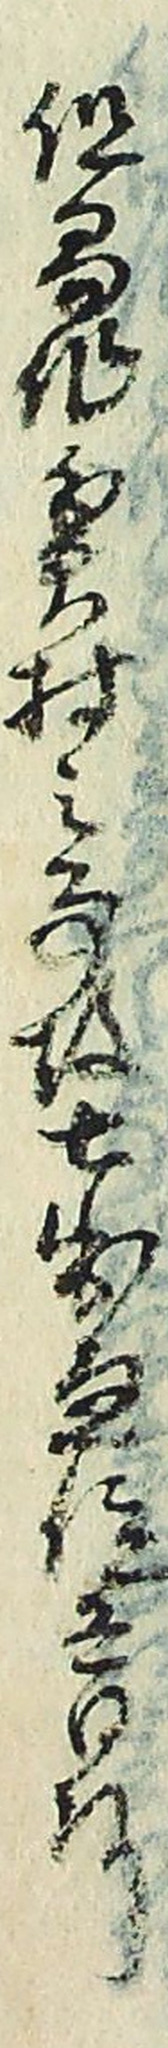但畠作貧村之事故七歩通位右同断
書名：諸御趣意書并御下知向之写
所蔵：鳴門教育大学 Naruto University of Education
